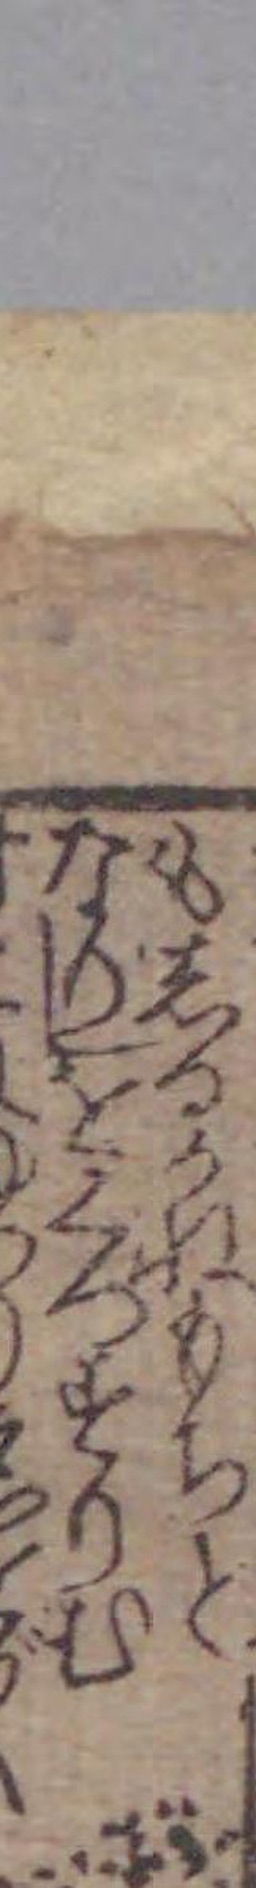なりしをくつすりむ
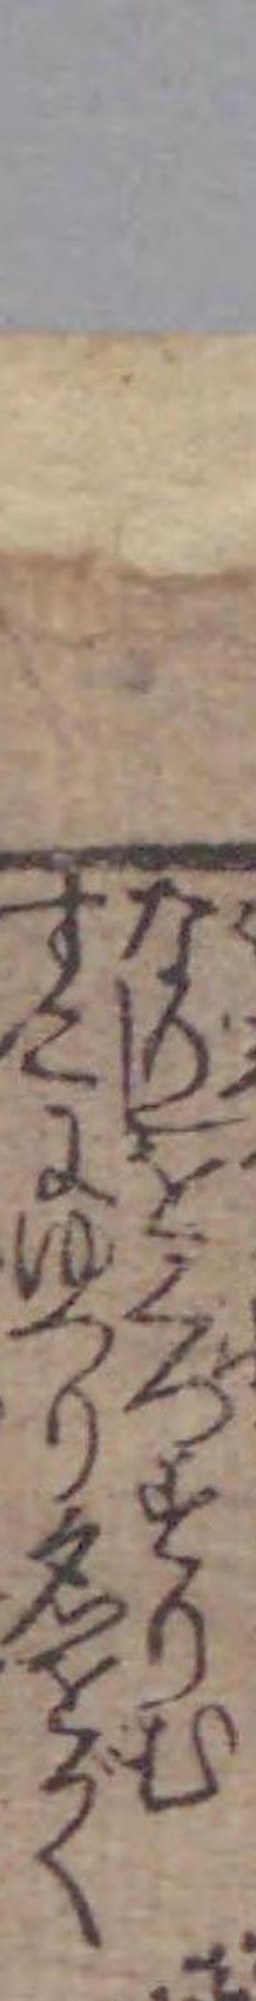すこにゆつり名をがく
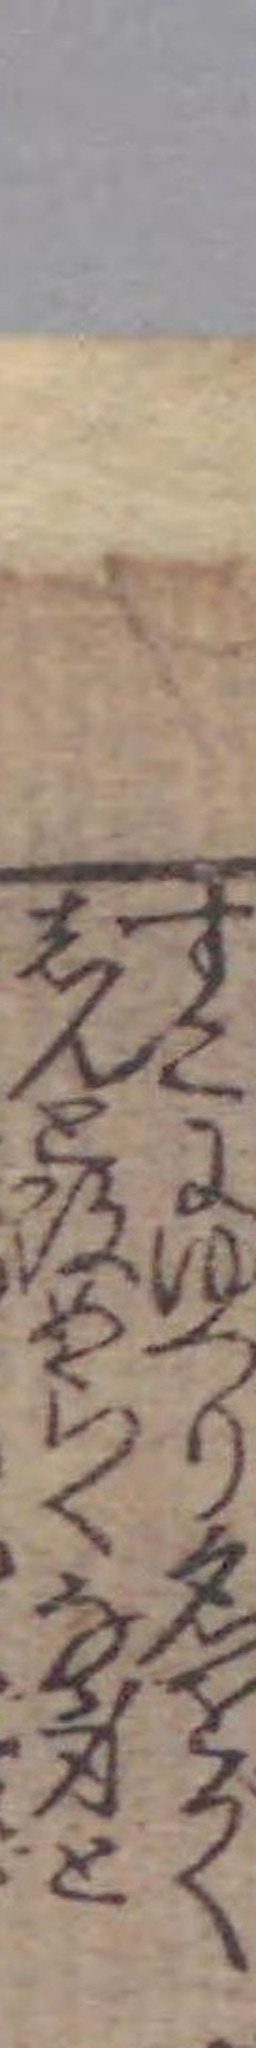じんと改めらくな身と
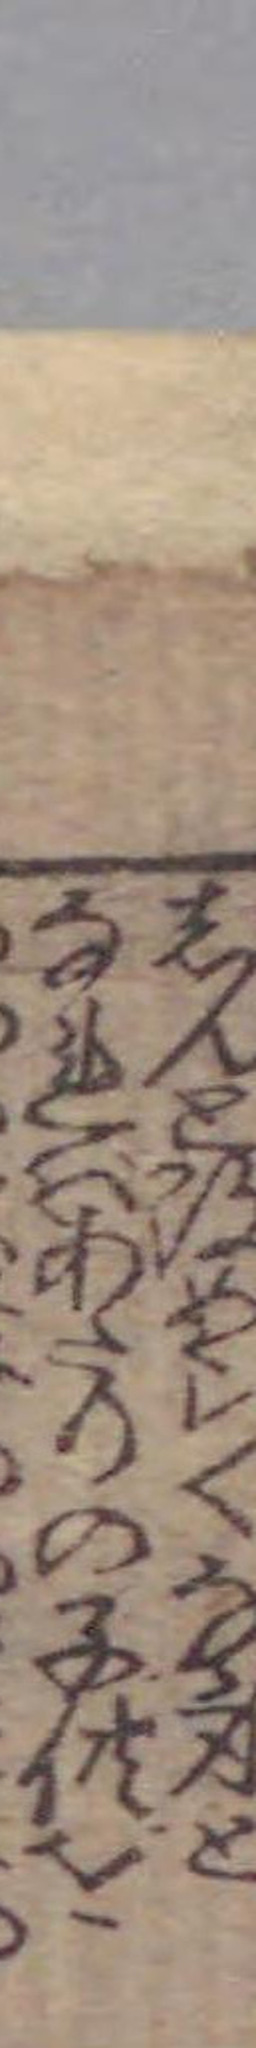なればあたりの子供を
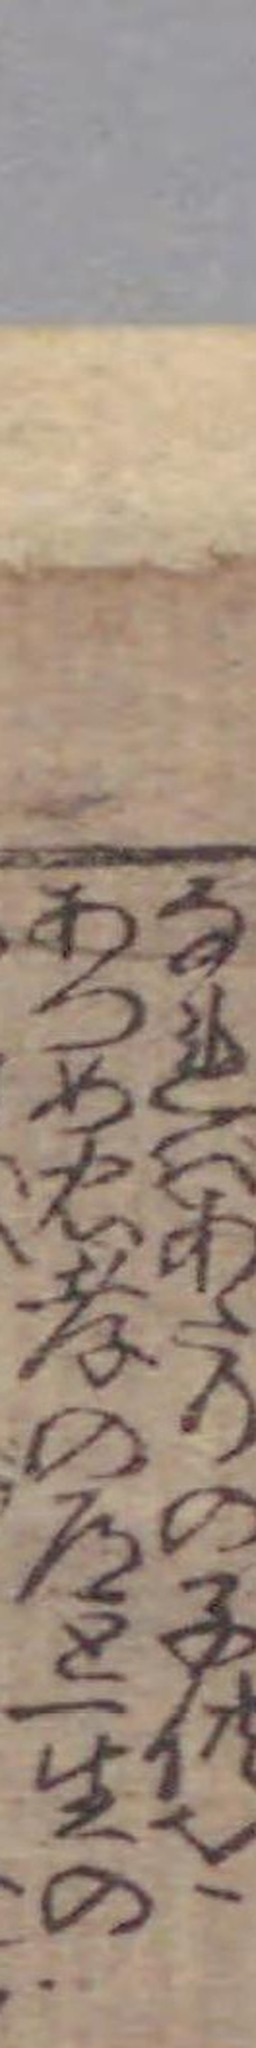あつめ忠孝の道と一生の
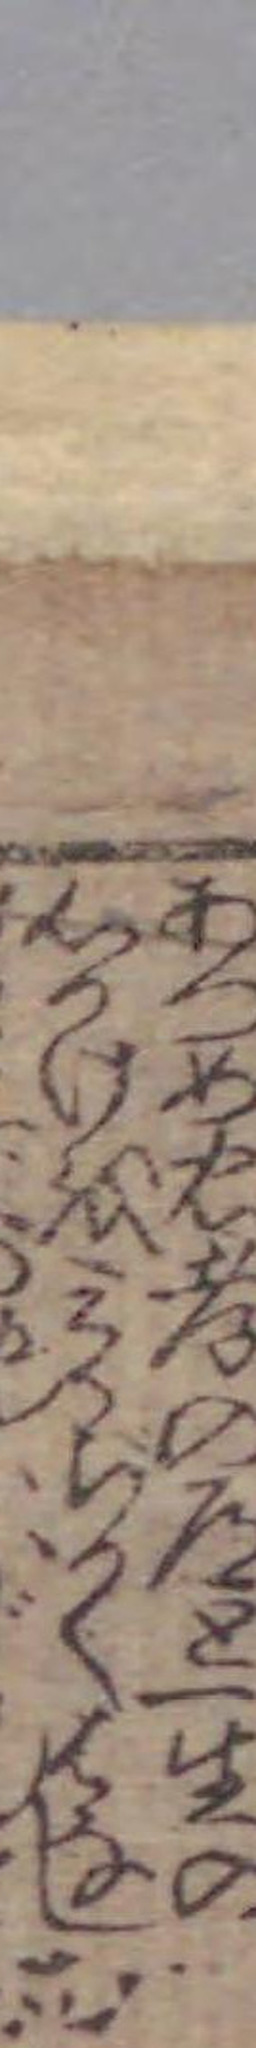心かけをみゝぢかくはなし
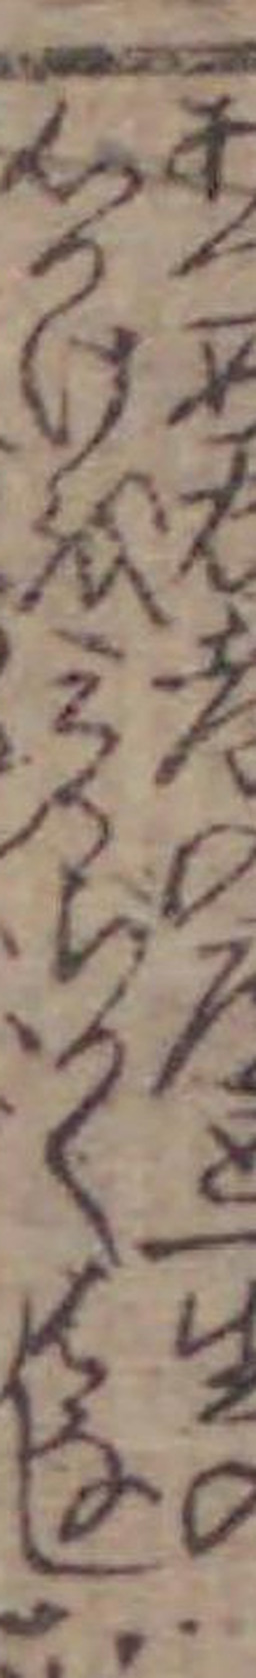心かけをみゝぢかくはなし
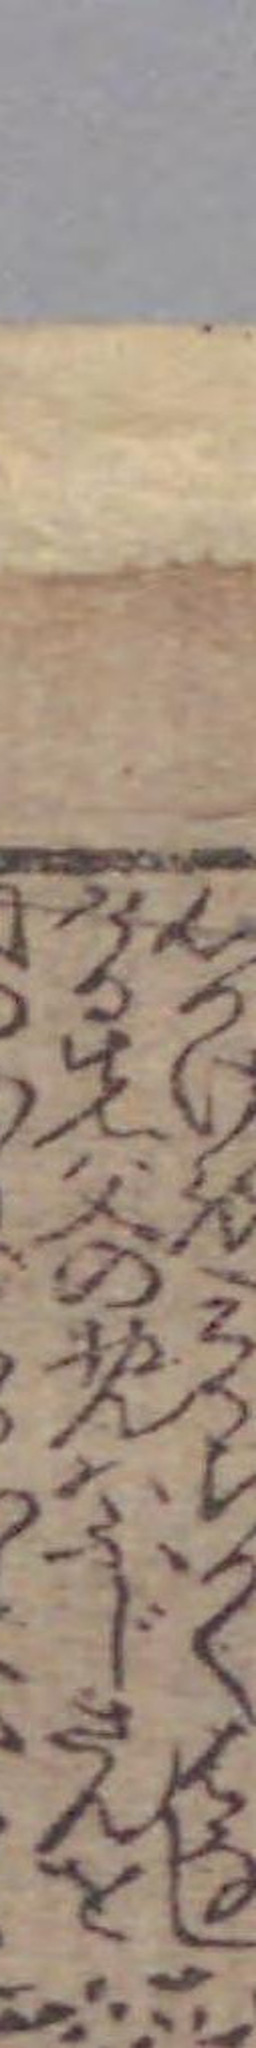ける先父のおんはふじさんを
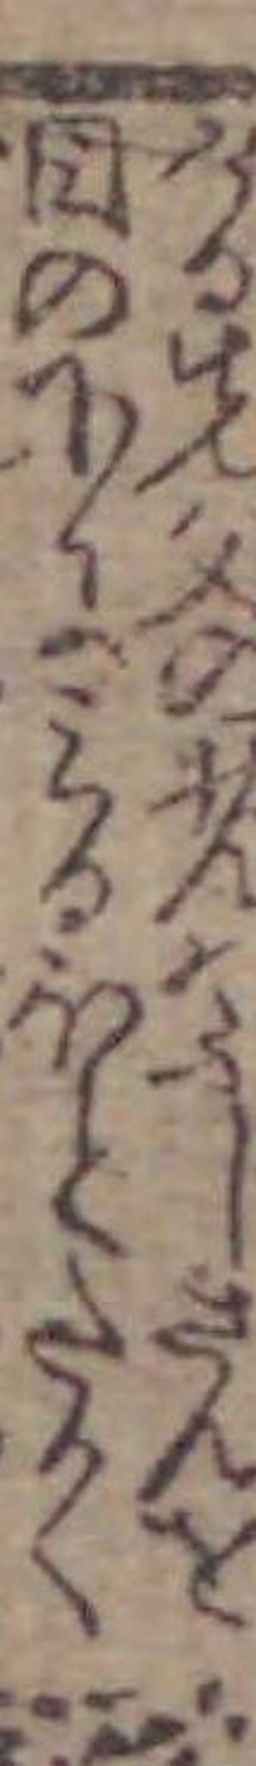目の下にみるほとたかく
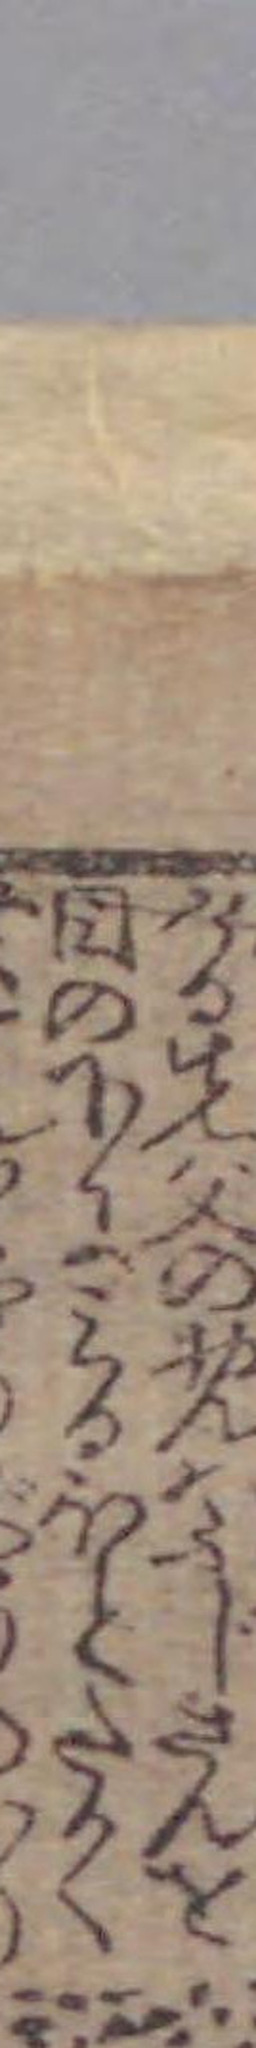目の下にみるほとたかく
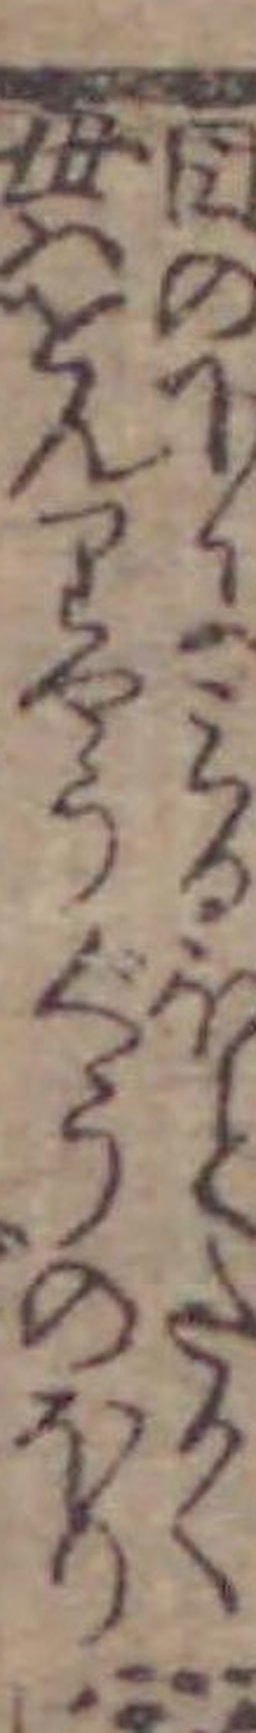母はをんりやうぐうのほり
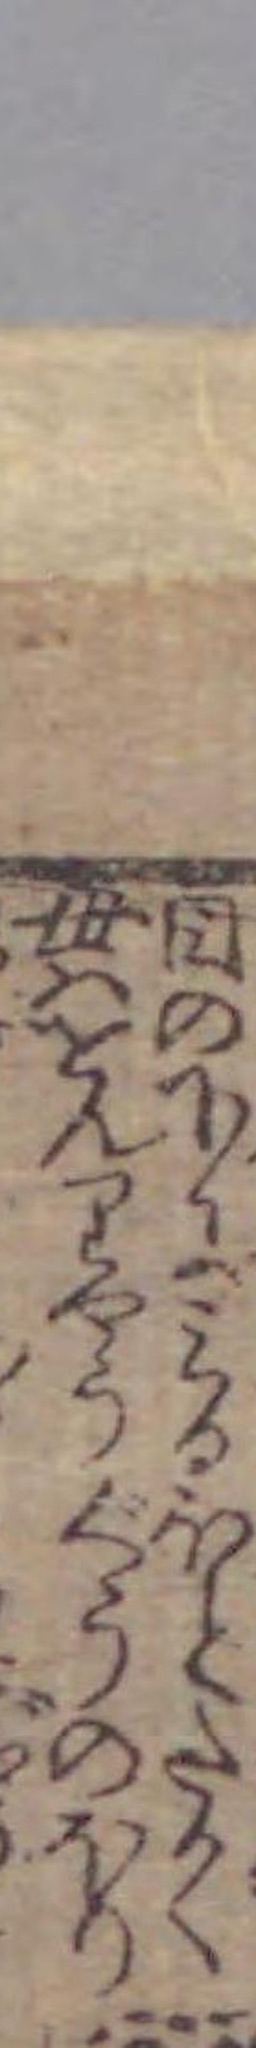母はをんりやうぐうのほり
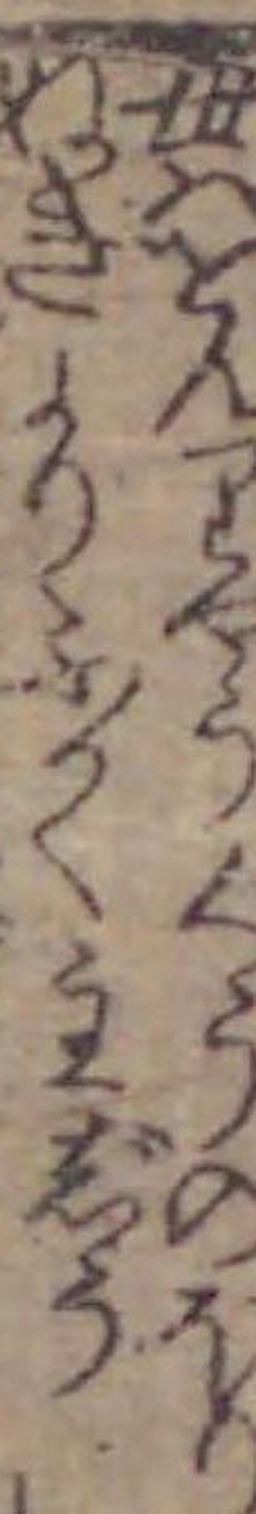ぬきよりふかく主じう
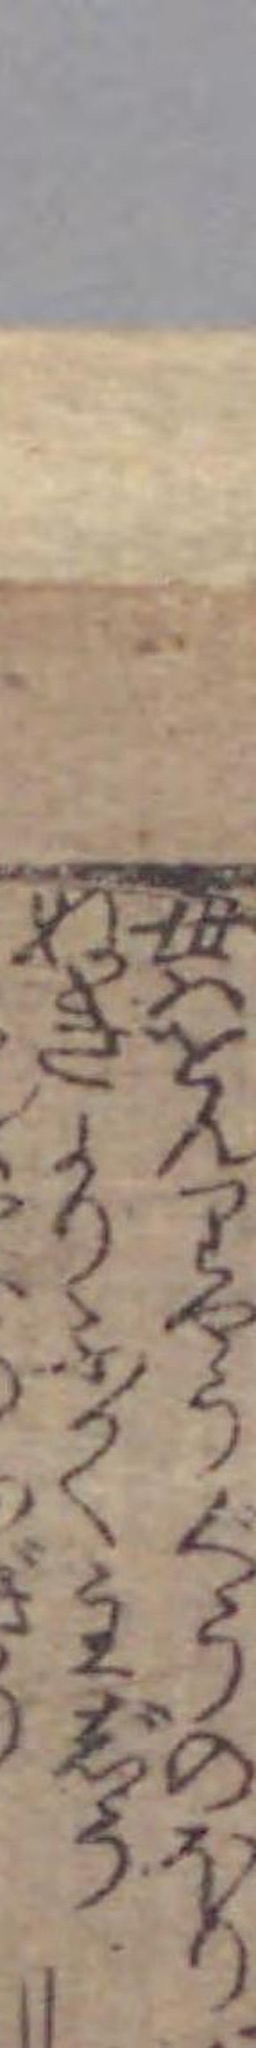ぬきよりふかく主じう
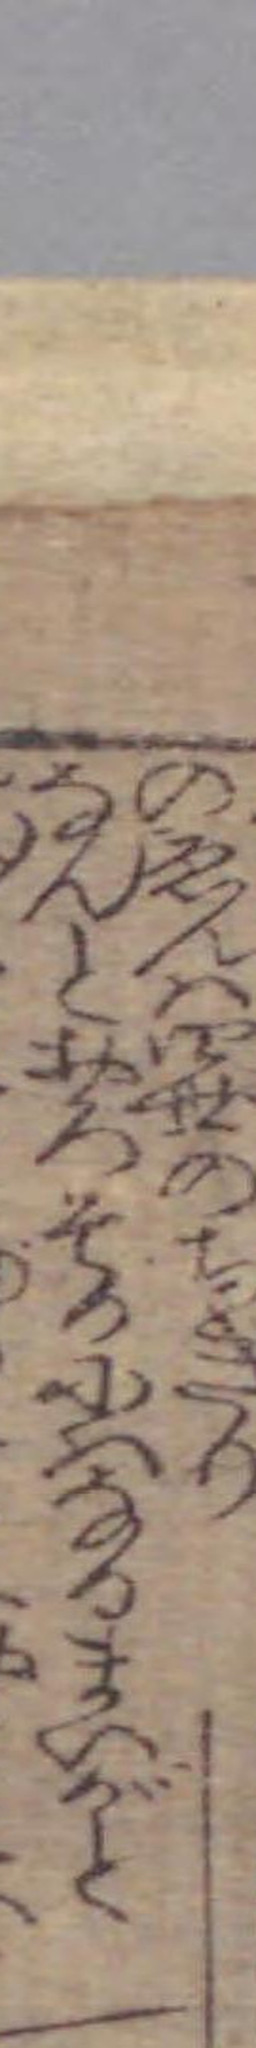なんとおろそかにはなるまいがと
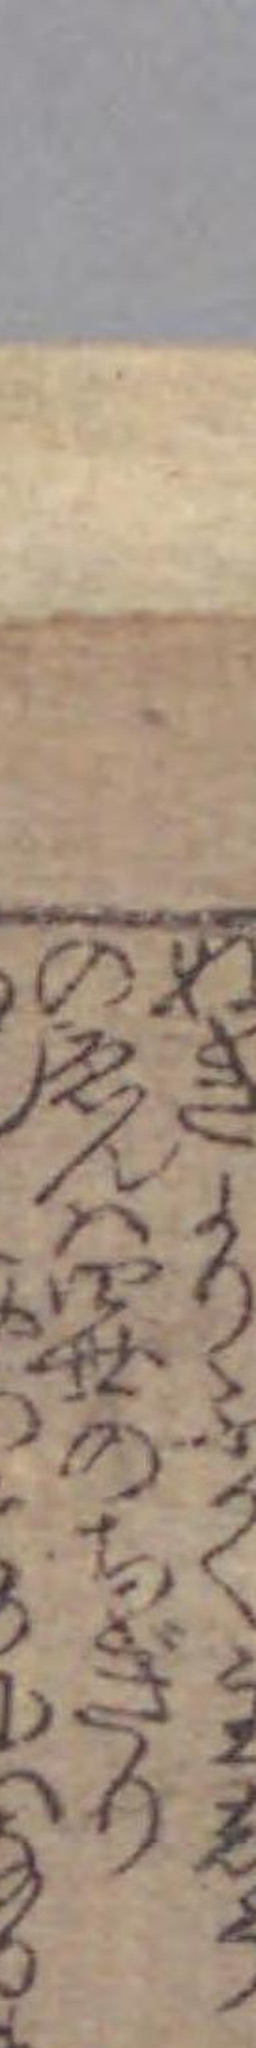のゑんは四世のちぎり
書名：即席耳学問 : 3巻
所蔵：国立国会図書館 National Diet Library, JAPAN
